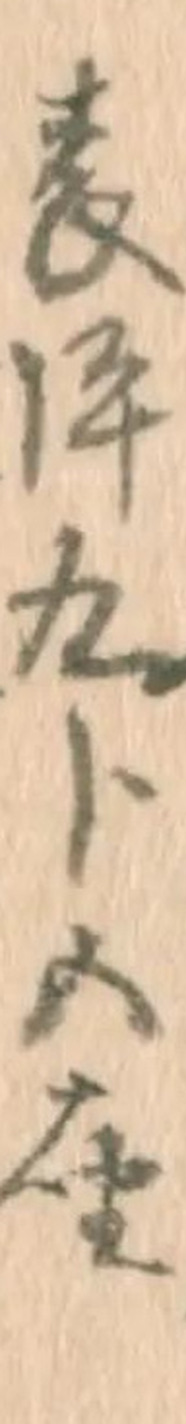表坪九分五厘

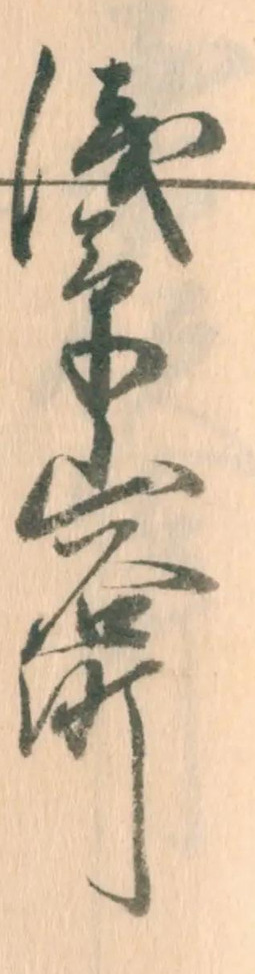浅草山谷町

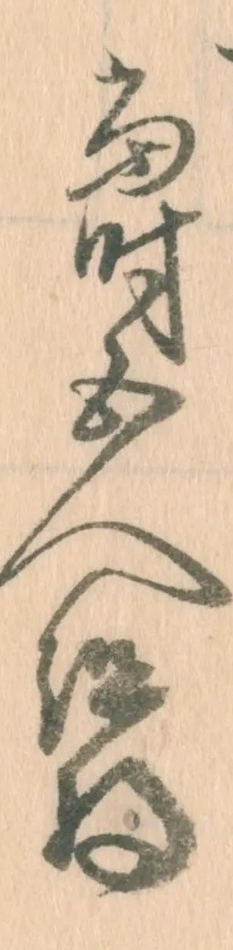当時五人組持
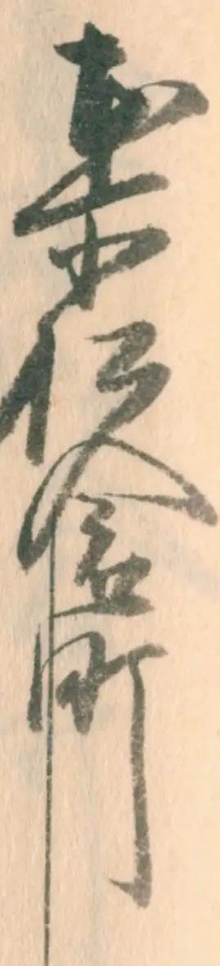本所松倉町

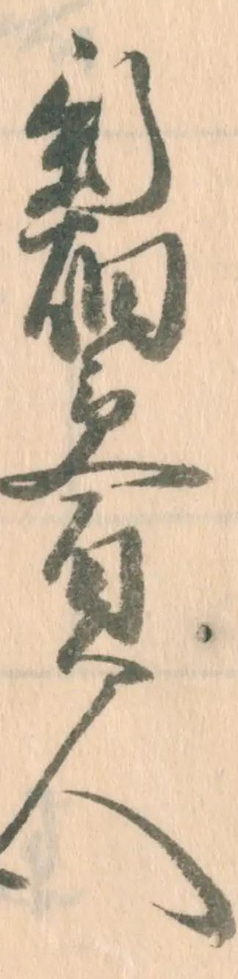新畑受負人
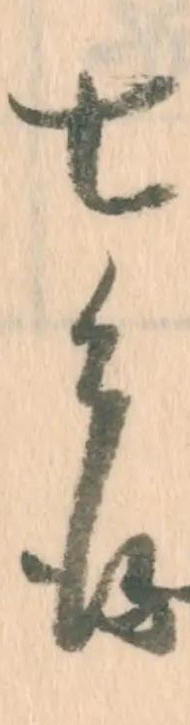七兵衛
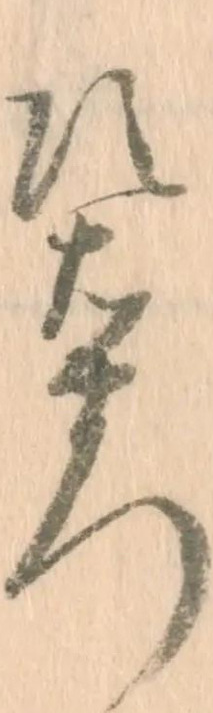次右衛門
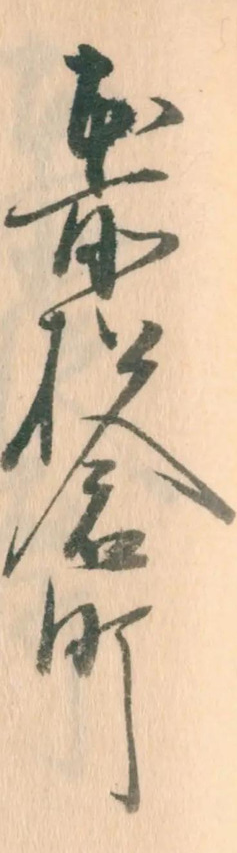本所松倉町

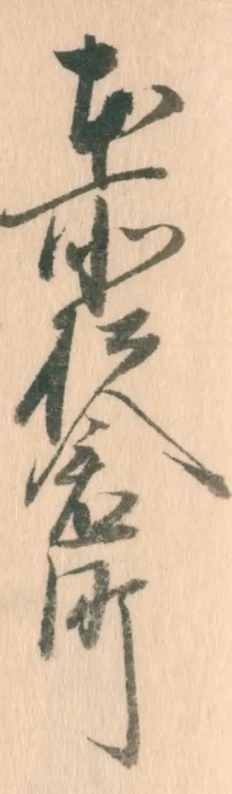本所松倉町

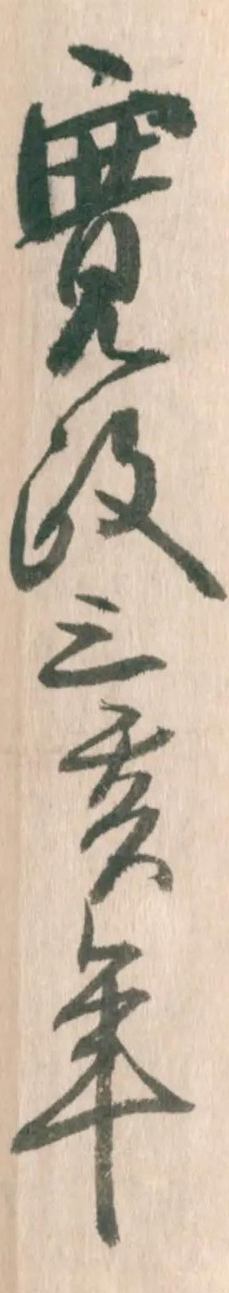寛政三亥年
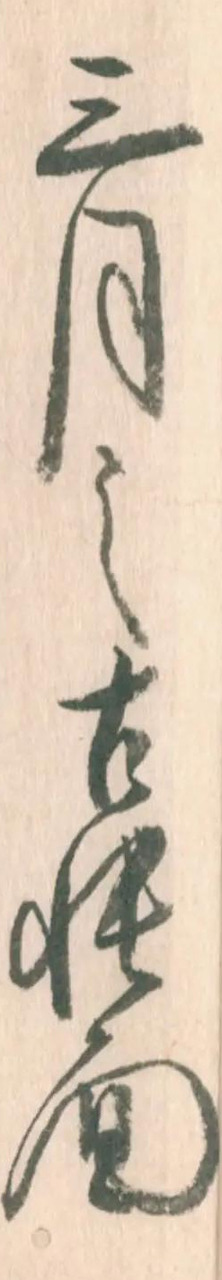三月之古帳面
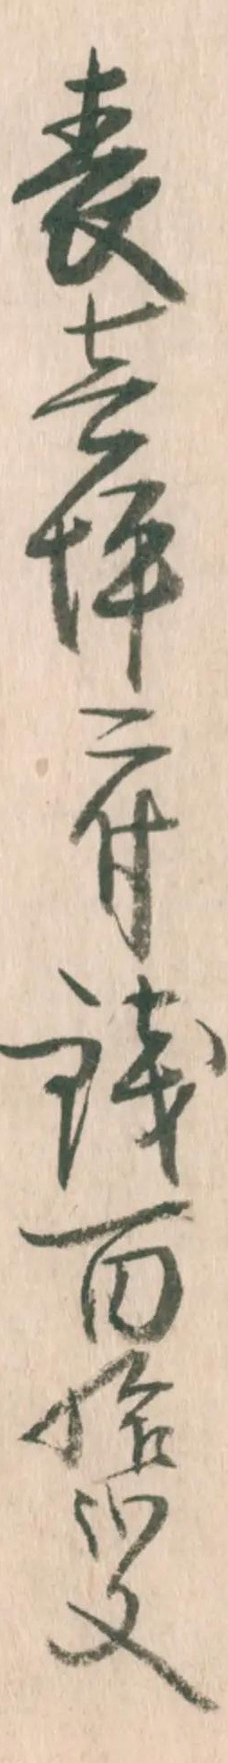表壱坪ニ付銭百拾弐紋文
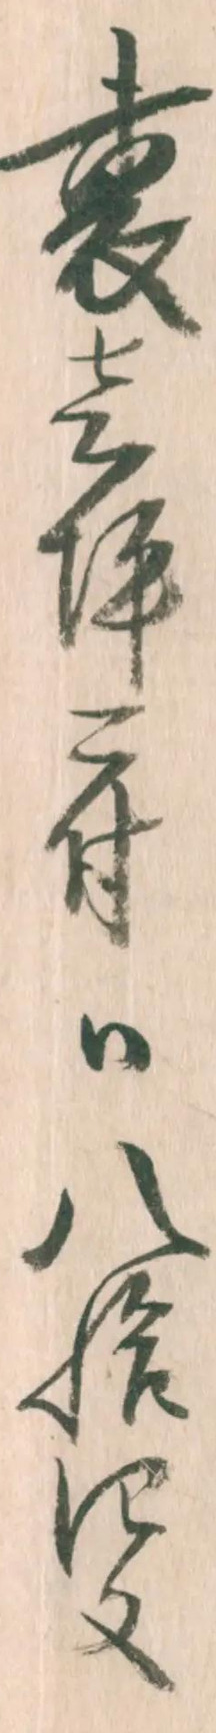裏壱坪ニ付同八拾四文
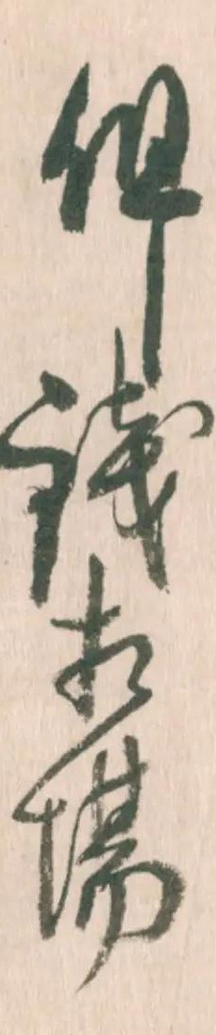但し銭相場
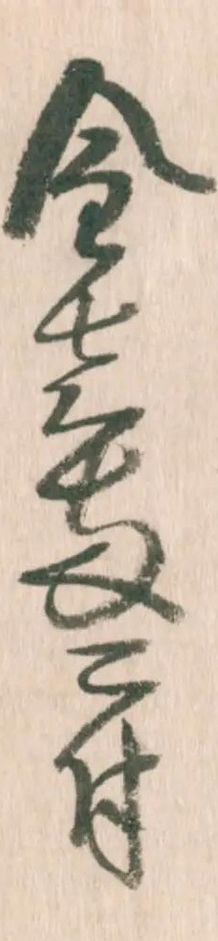金壱両ニ付
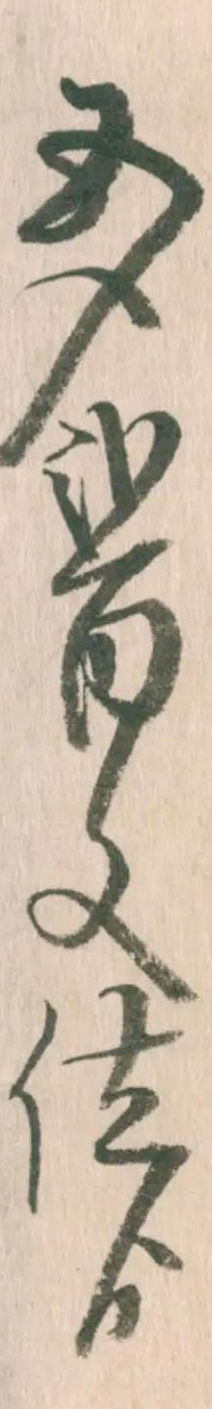五貫弐百文位ゟ
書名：地震災書留 2巻. [1] 内表紙に「地震災書留　安政二卯年　但本所深川御用屋敷地代免除調」とあり
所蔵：国立国会図書館 National Diet Library, JAPAN
